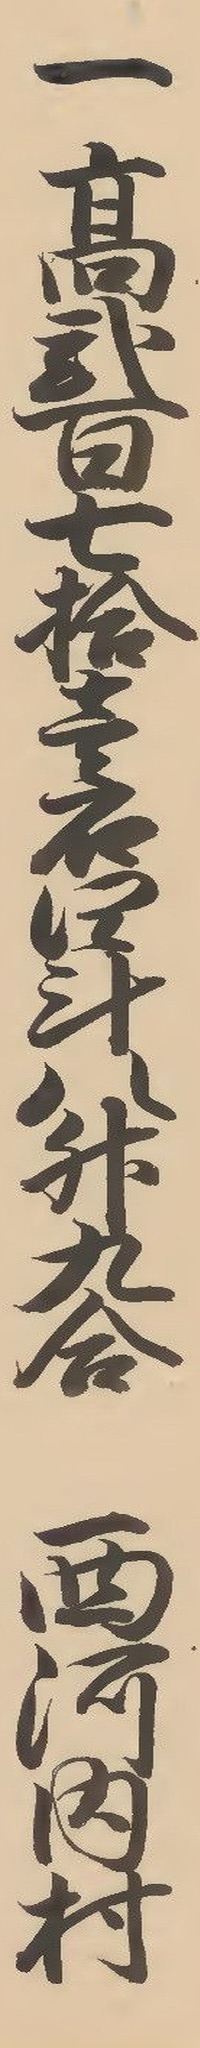一髙弐百七拾壱石四斗八升九合西河内村
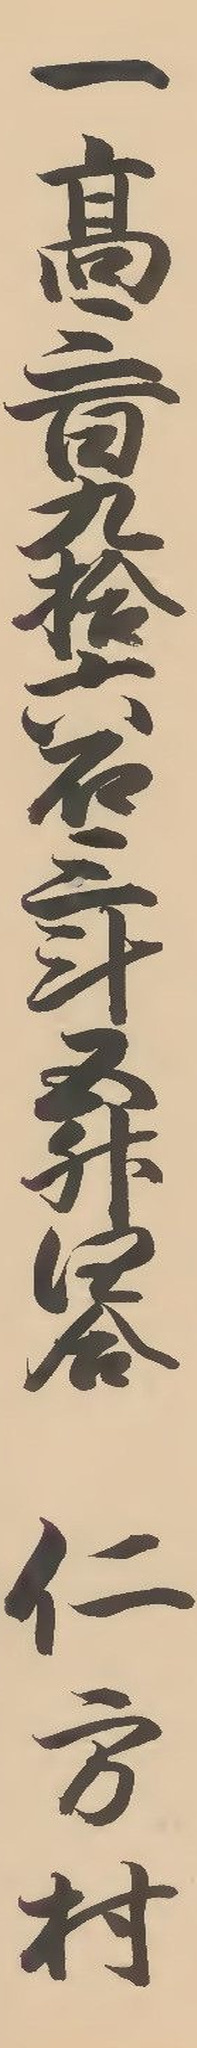一髙三百九拾六石三斗五升四合仁方村
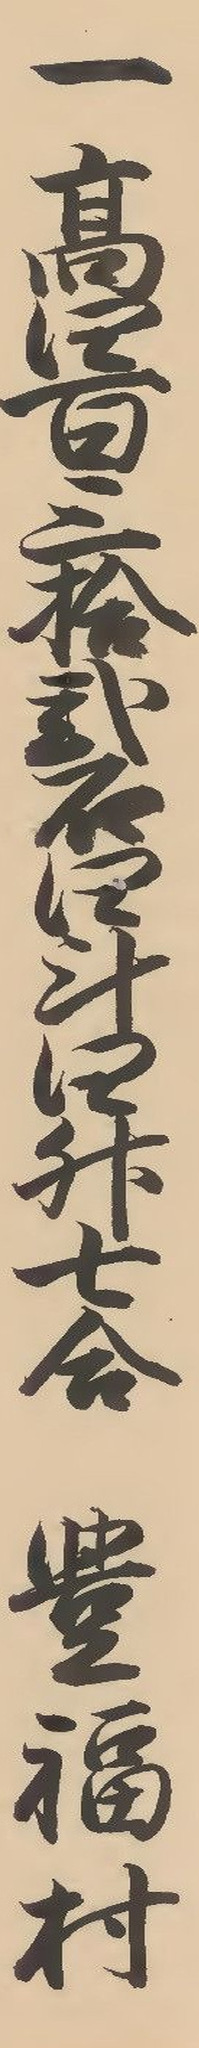一髙四百三拾弐石四斗四升七合豊福村
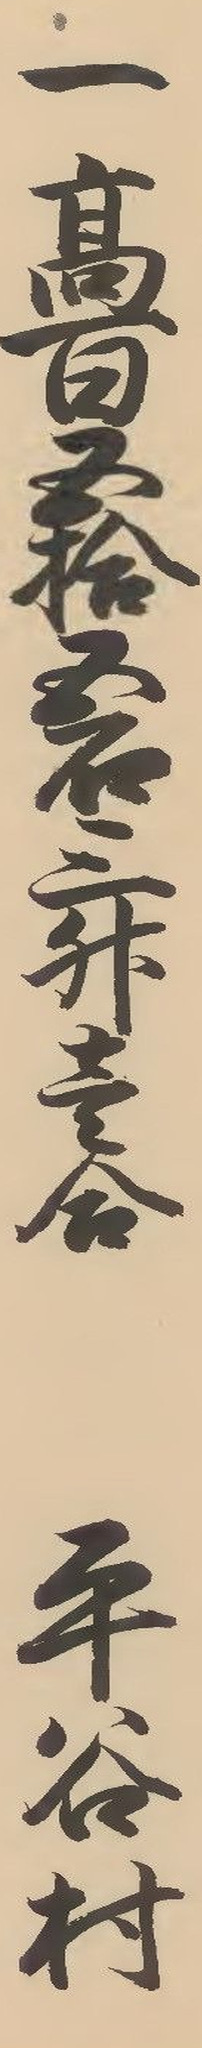一髙百五拾五石三升壱合平谷村
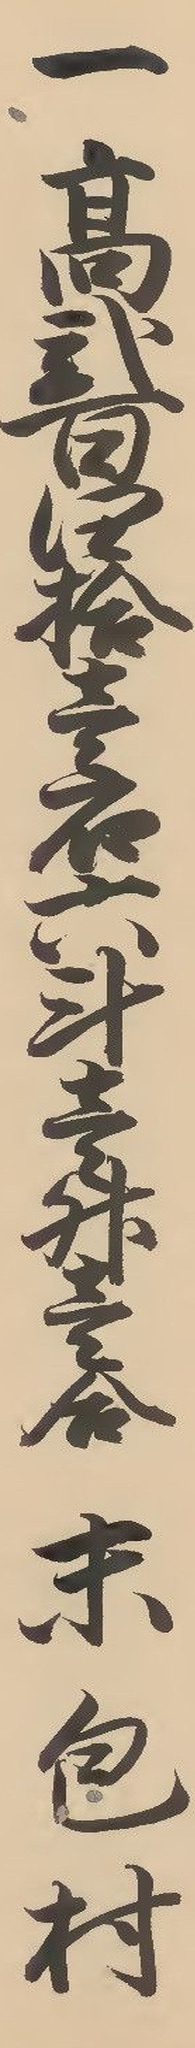一髙弐百四拾壱石六斗壱升壱合末包村
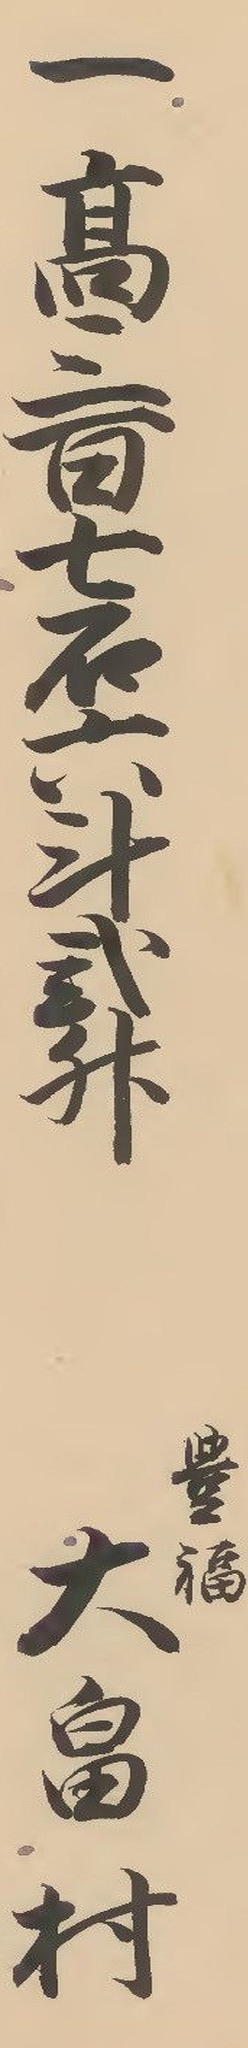一髙三百七石六斗弐升大畠村

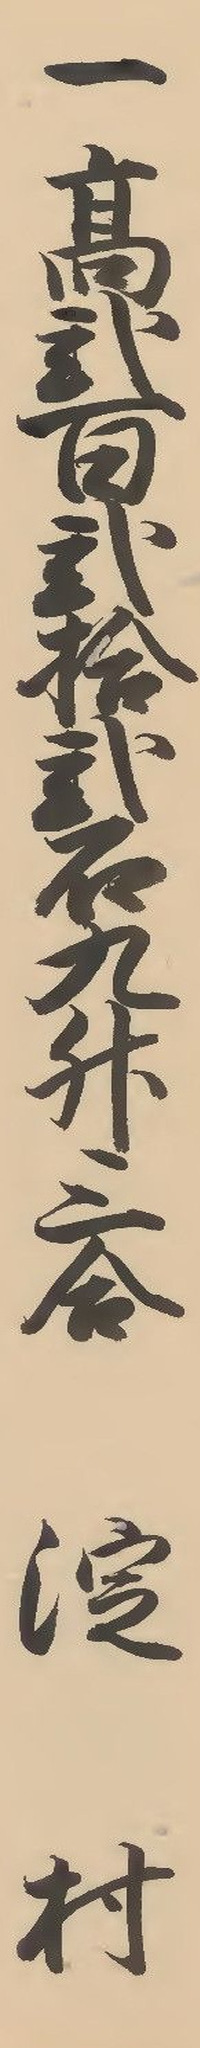一髙弐百弐拾弐石九升三合淀村
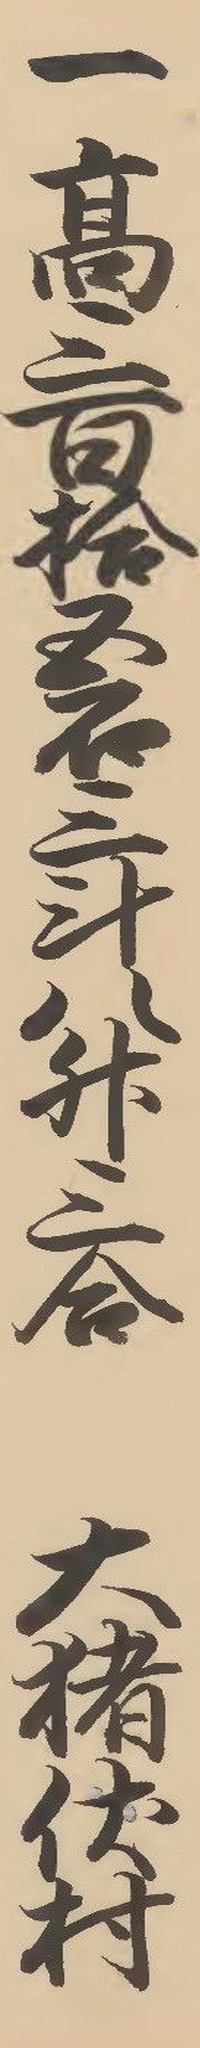一髙三百拾五石三斗八升三合大猪伏村
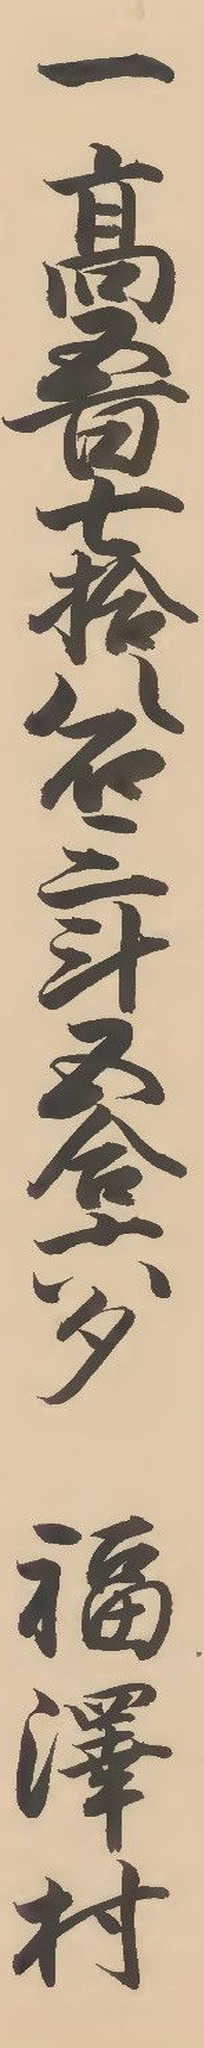一髙五百七拾八石三斗五合六夕福澤村
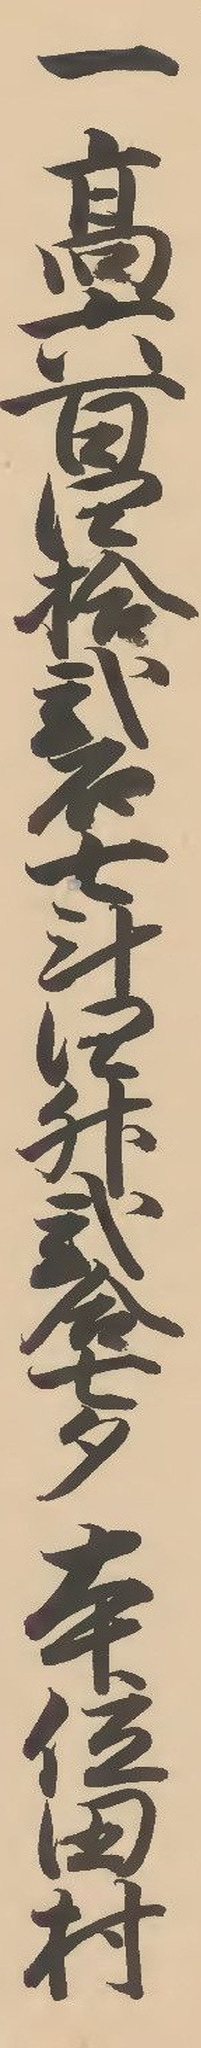一髙六百四拾弐石七斗四升弐合七夕本位田村
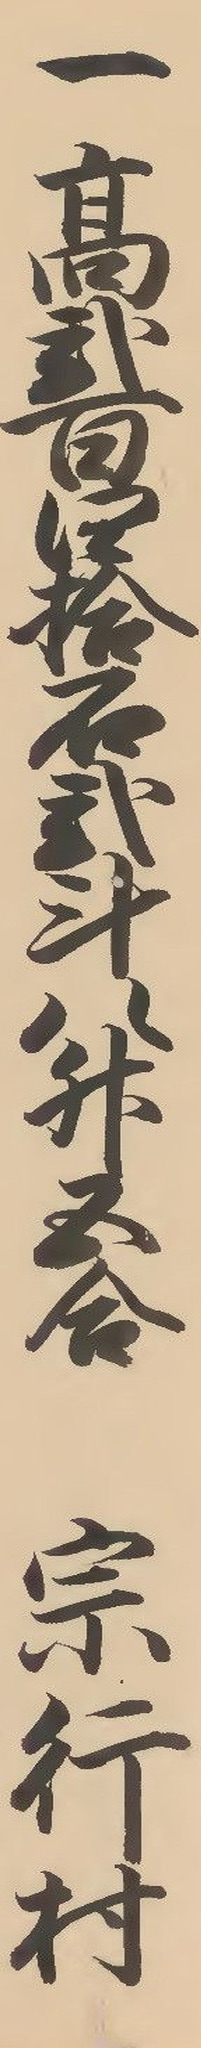一髙弐百四拾石弐斗八升五合宗行村
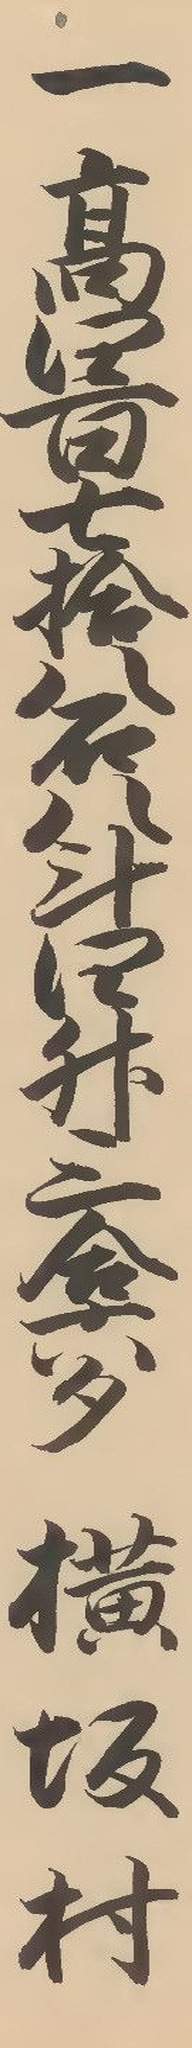一髙四百七拾八石八斗四升三合六夕横坂村
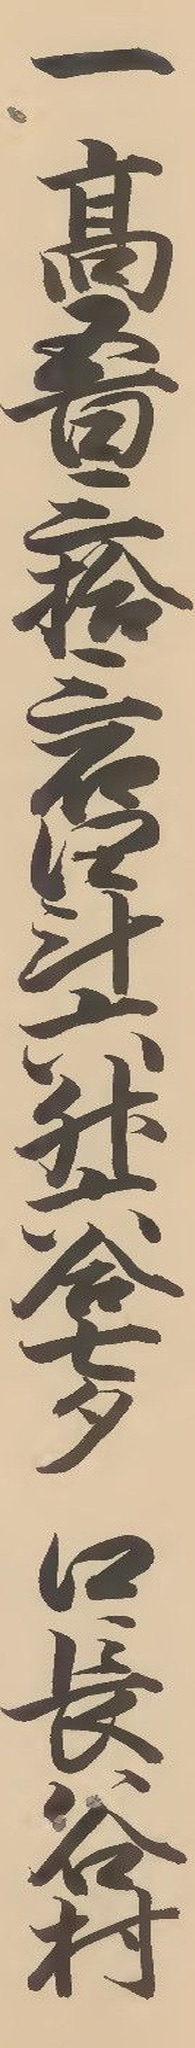一髙五百三拾三石四斗六升六合七夕口長谷村
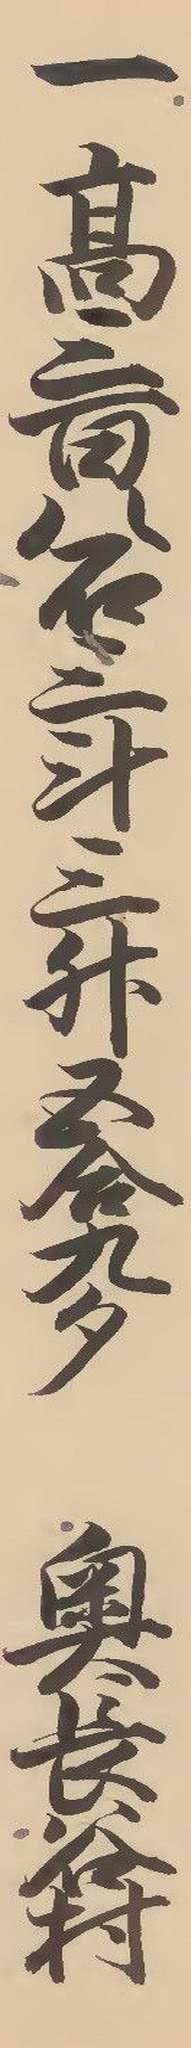一髙三百八石三斗三升五合九夕奥長谷村

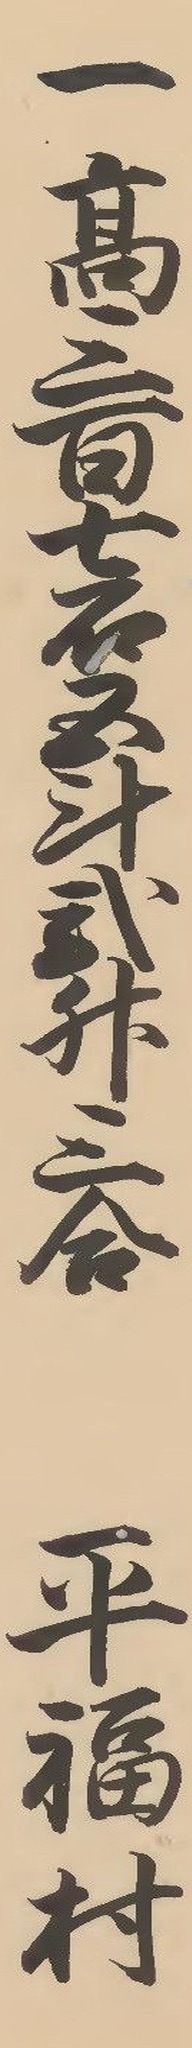一髙三百七石五斗弐升三合平福村
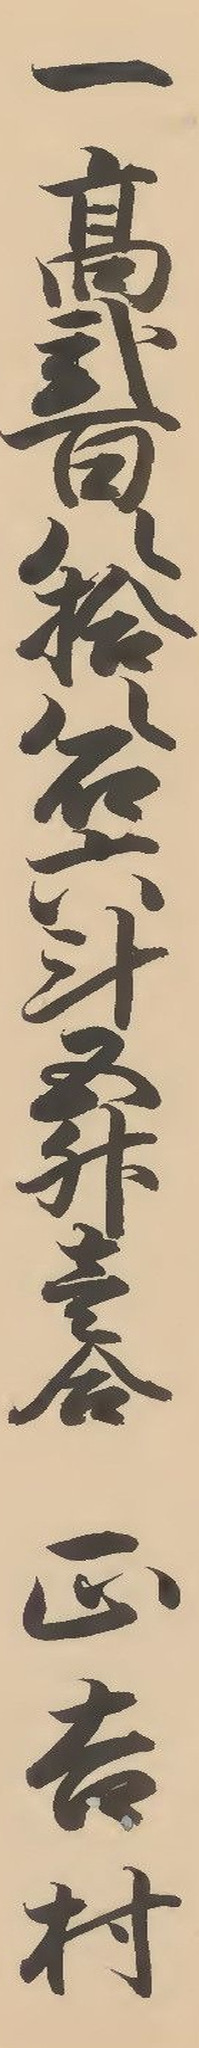一髙弐百八拾八石六斗五升壱合正吉村
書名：播磨国郷帳
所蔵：国立公文書館 National Archives of Japan
